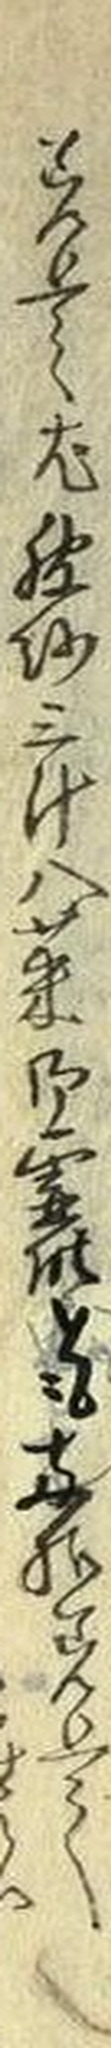差上之尤服紗三汁八菜御霊供とも両様差上之
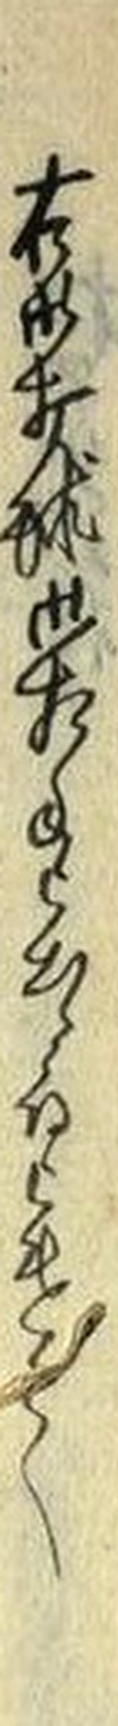右御打毬御相手被出候ニ付被遣之
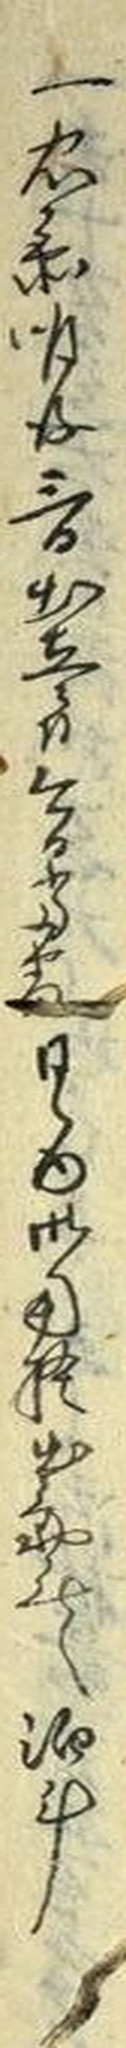一忠兵衛明後三日出立ニ付今日当番日之内御用捨出勤無之泊斗
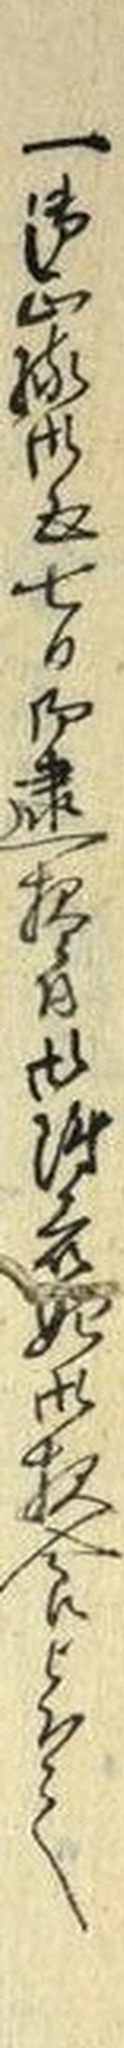一御正統五七日御逮夜ニ付御附衆始御夜食被下之
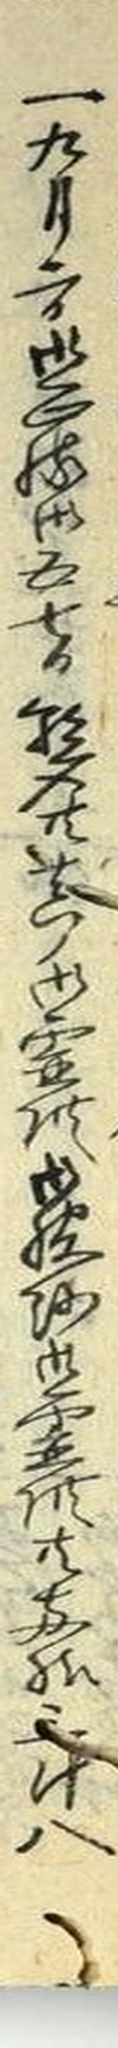一九月二日御正統御五七日朝夕共真之御霊供御服紗御霊供共両様三汁八
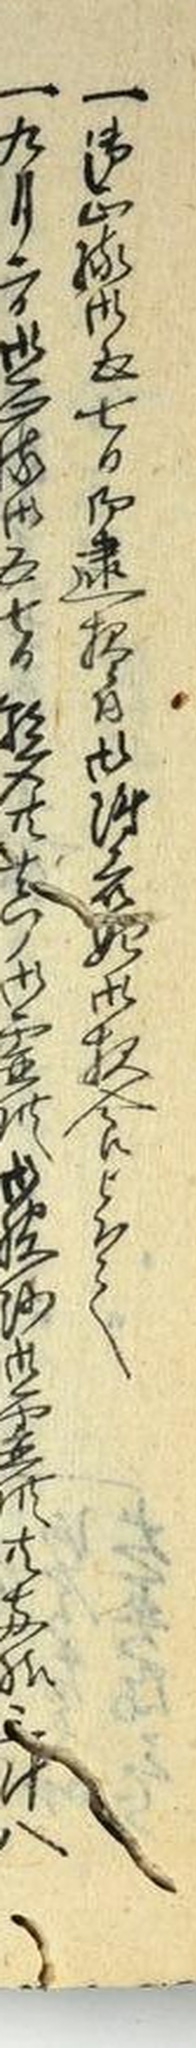一九月二日御正統御五七日朝夕共真之御霊供御服紗御霊供共両様三汁八
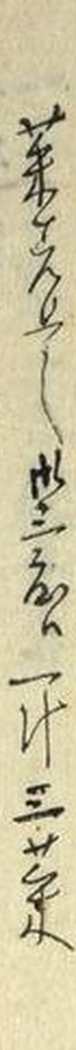菜差上之御三度ハ一汁三菜
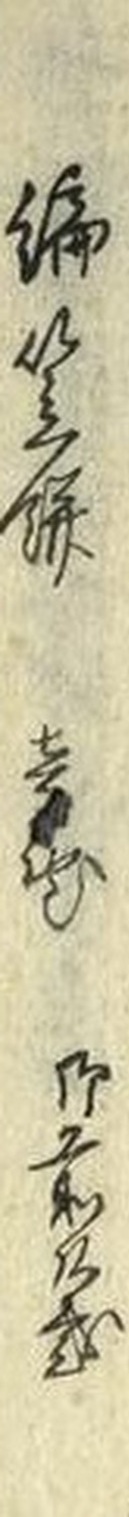編笠餅壱台御前頂戴
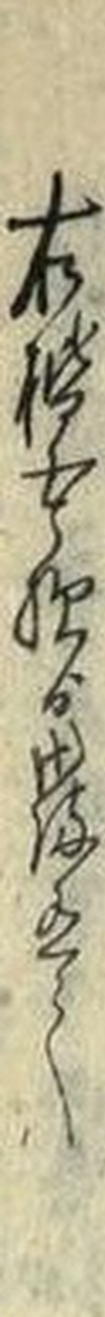右楷五郎様ゟ御備有之
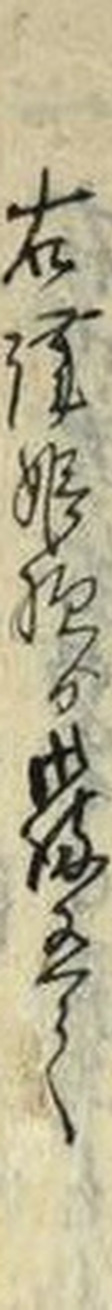右楷五郎様ゟ御備有之

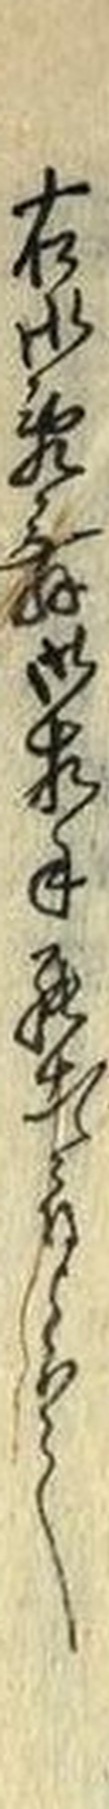右御乱舞御相手罷出候ニ付被下之
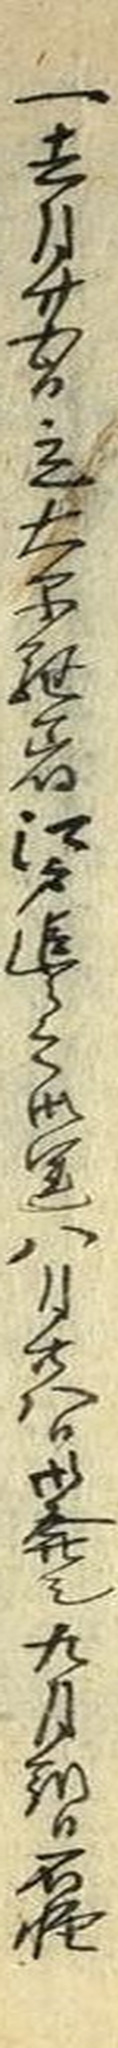一去月廿五日立大早駆着江戸追々御運八月廿八日御発シ九月朔日不軽
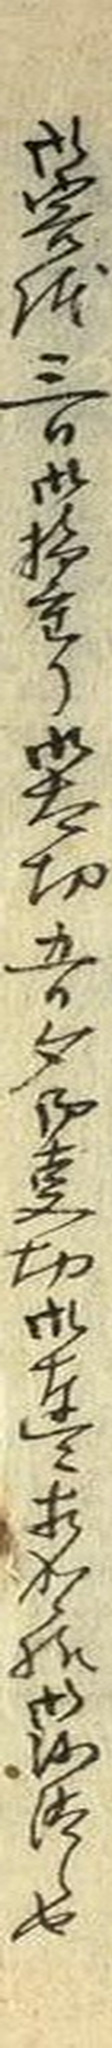御容体三日御指重り御太切五日夕御事切御達ニ相成候様御沙汰之由
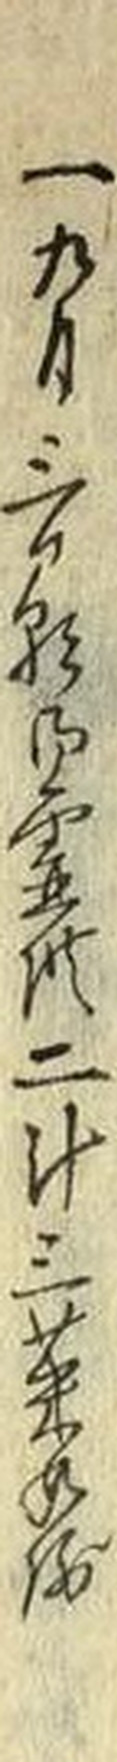一九月三日朝御霊供二汁三菜如例
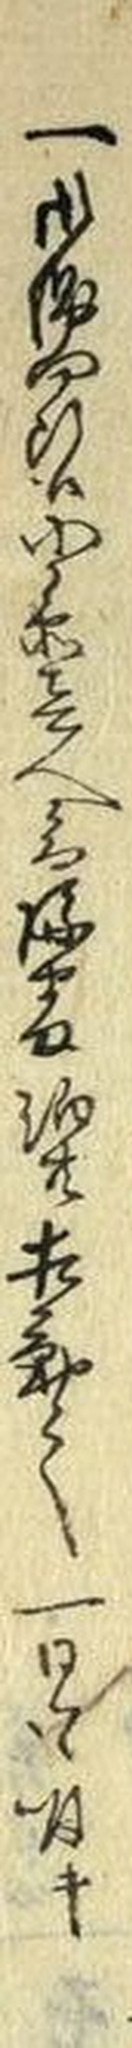一御側向頭取小兵衛壱人ニ而隔番泊共相勤之一日ツヽ明キ
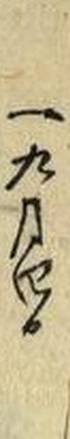一九月四日
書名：少傅日録抄（斉善付側向頭取日記、江戸并道中、初入在国、逝去後…
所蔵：福井県文書館 Fukui Prefectural Archives
